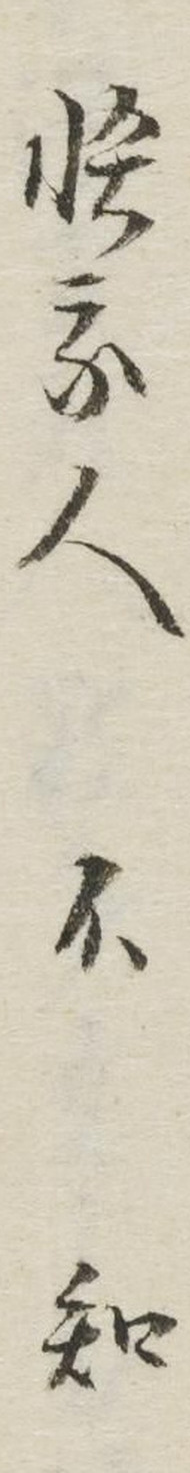怪我人不知
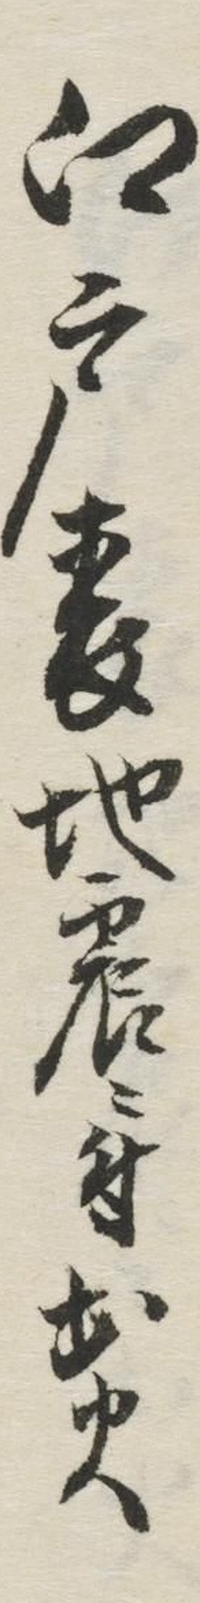江戸表地震ニ付出火
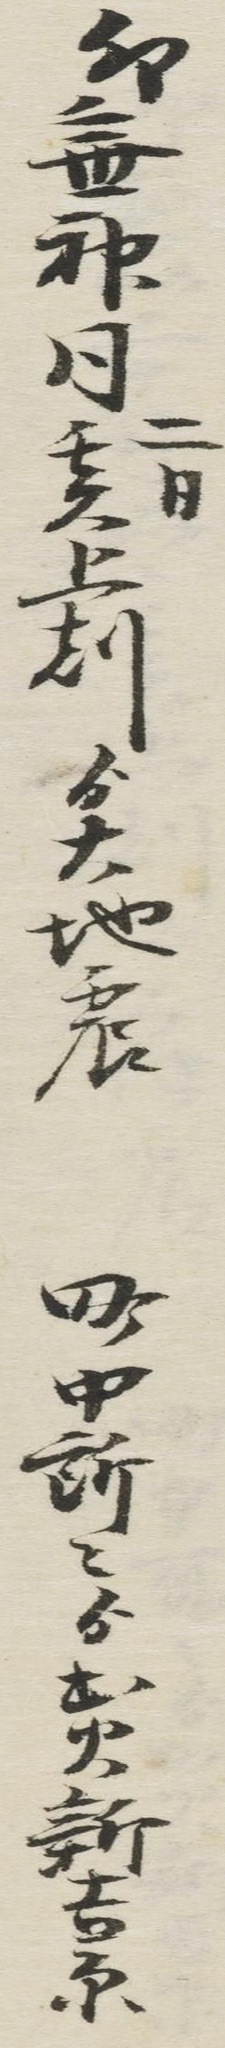無神月二日亥上刻ゟ大地震町中所々ゟ出火新吉原
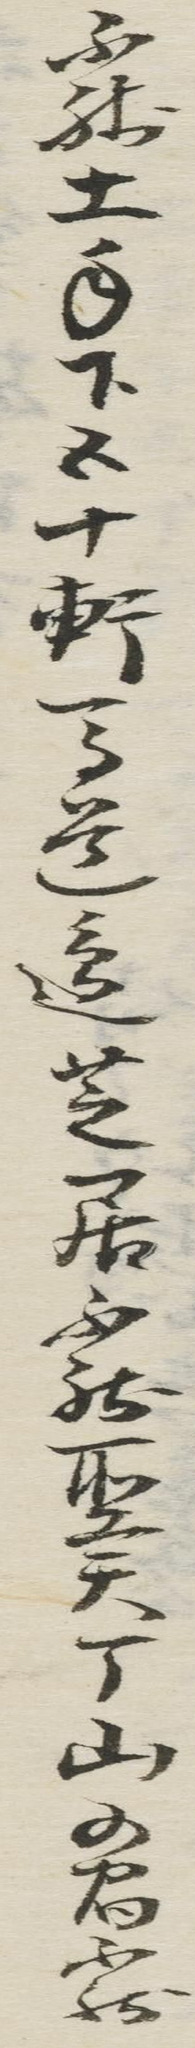不残土手下五十軒馬道辺芝居不残聖天丁山の宿不残
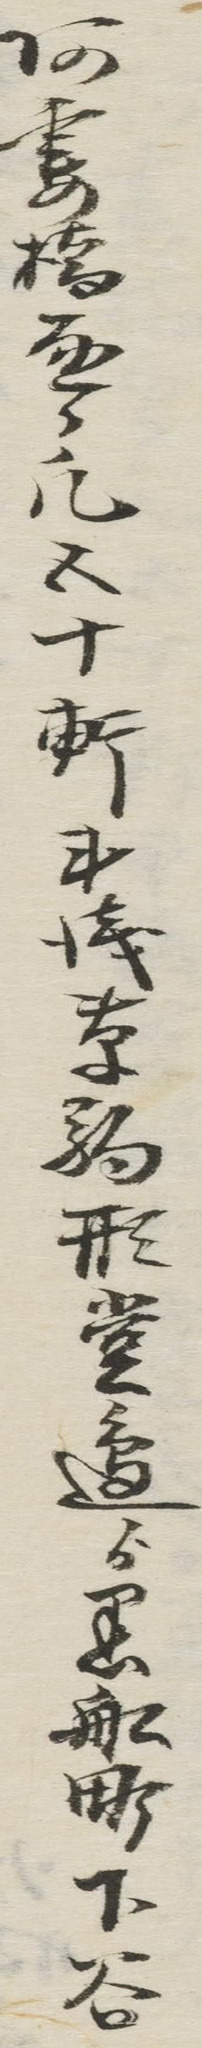吾妻橋通り凡五十軒斗浅草駒形堂辺ゟ黒船町下谷
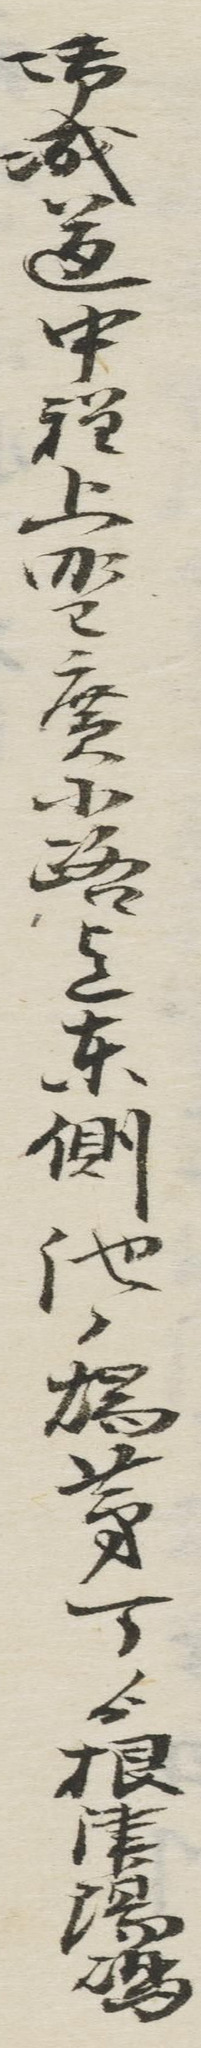御城道中程上野広小路迄東側池ノ端茅丁ゟ根津湯嶋
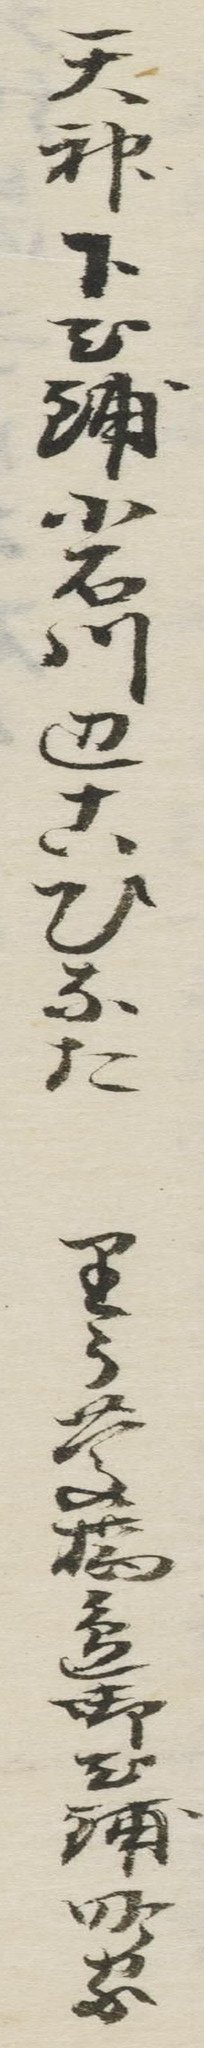天神下屋鋪小石川辺こひなたりう慶橋辺御屋鋪町家
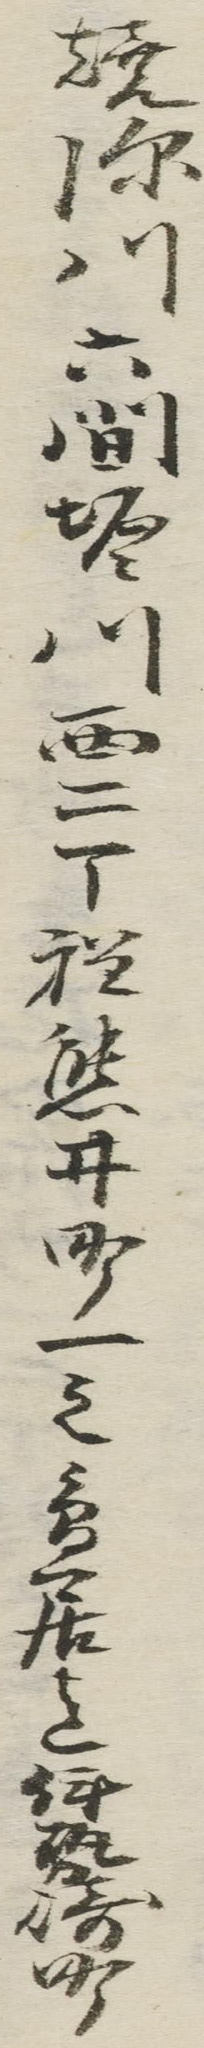焼深川六間堀川西二丁程熊井町一之鳥居迄伊勢崎町

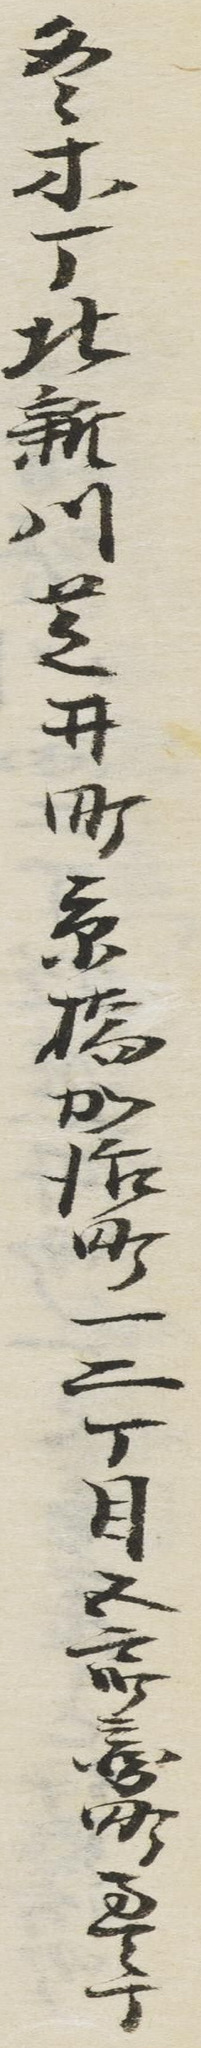冬木丁北新川芝井町京橋加治町一二丁目五郎兵衛町南天丁
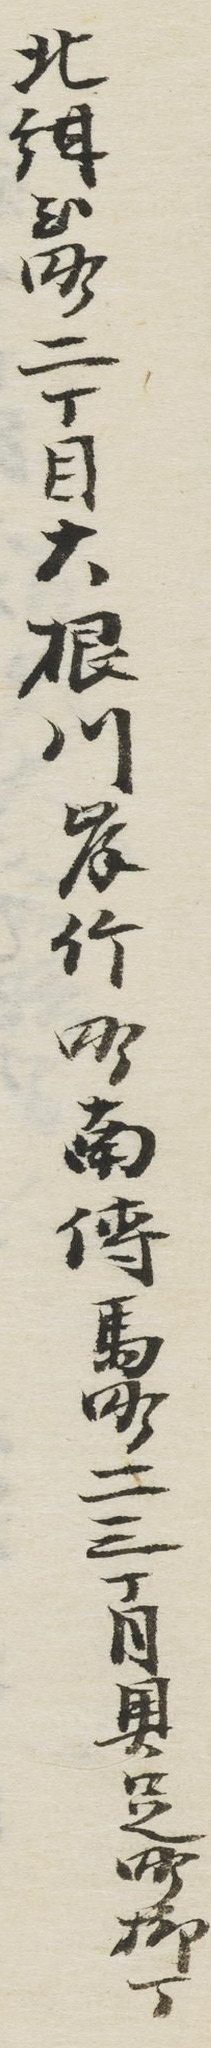北紺屋町二丁目大根川岸竹町南伝馬町二三丁目具足町柳丁
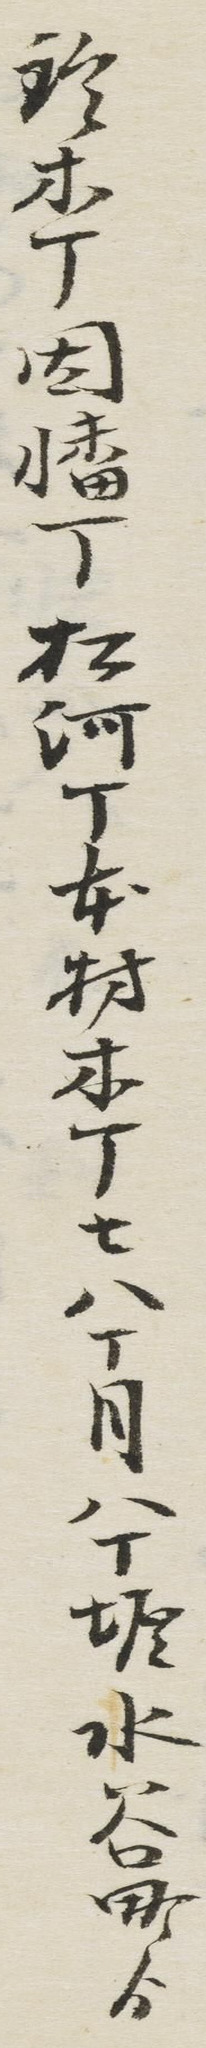鈴木丁因幡丁松河丁本材木丁七八丁目八丁堀水谷町ゟ
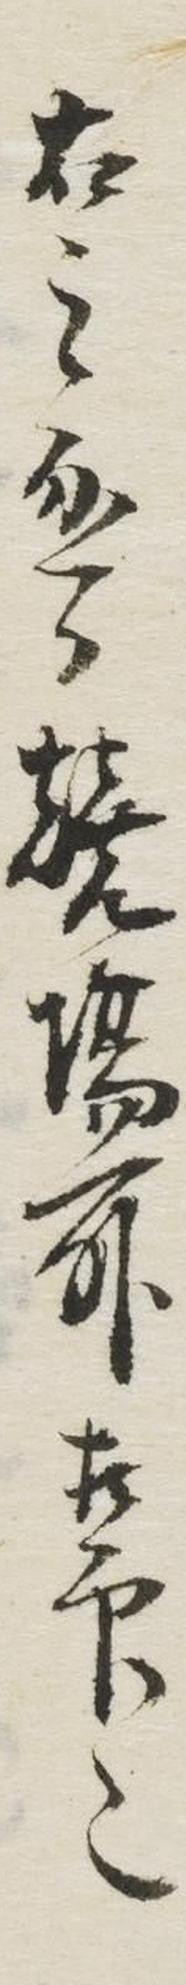右之通り焼場所相印也
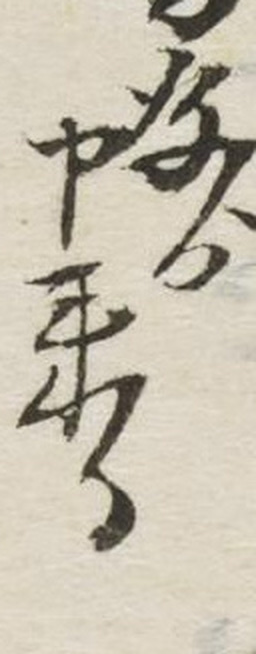申来る
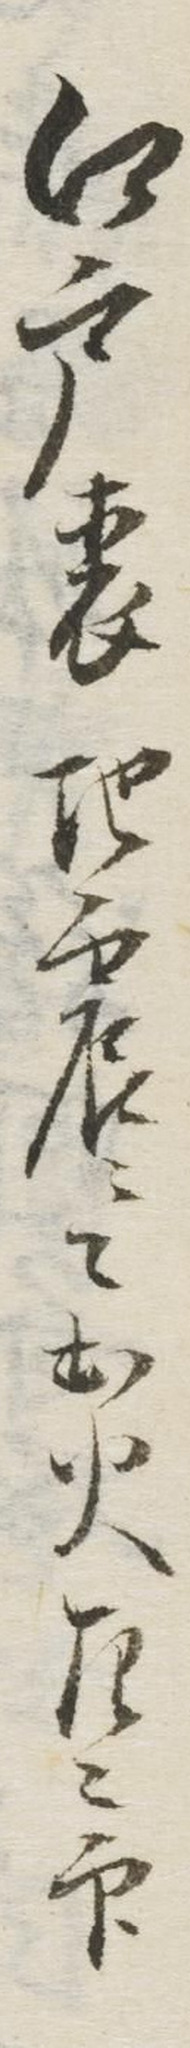江戸表地震ニて出火左ニ印
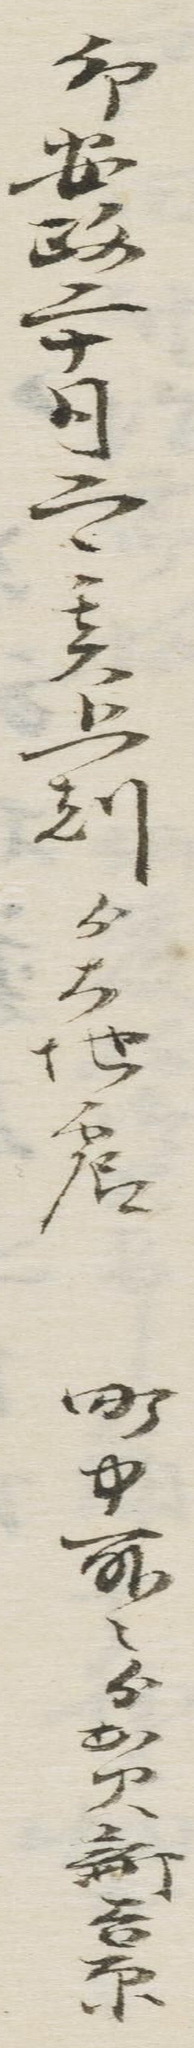卯安政ニ十月二日亥上刻ゟ大地震町中所々ゟ出火新吉原
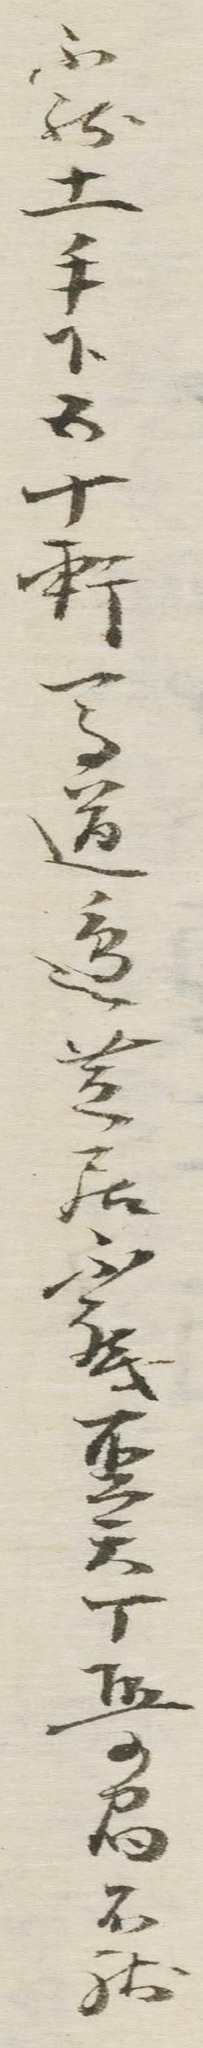不残土手下五十軒馬道辺芝居不残聖天丁の宿不残
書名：諸国大地震大津波一代記
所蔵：東京大学地震研究所図書室 Earthquake Research Institute Library, The University of Tokyo, JAPAN
